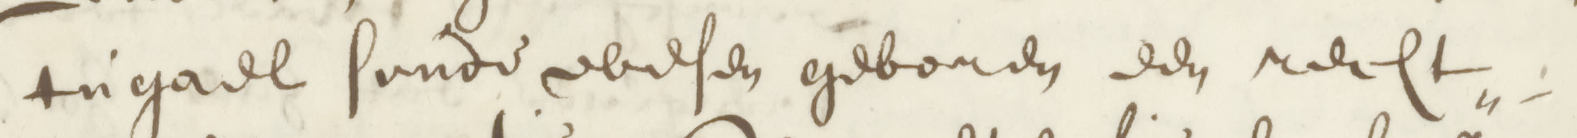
tugael soude wesen geboren een recht„
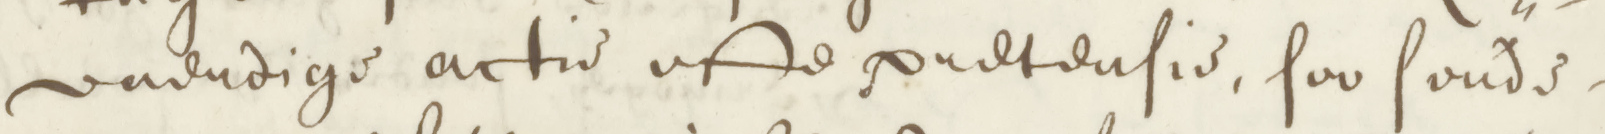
vaerdige actie ofte pretensie, soo soude
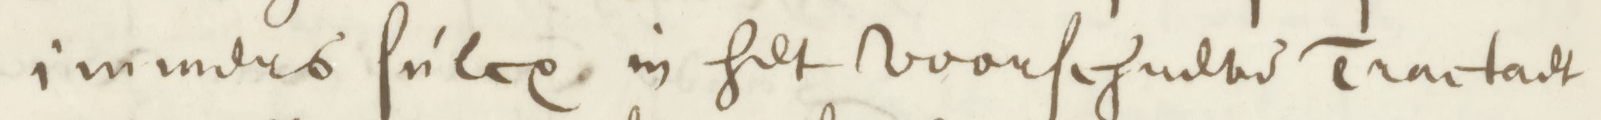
immers sulcx in het voorschreve Tractaet
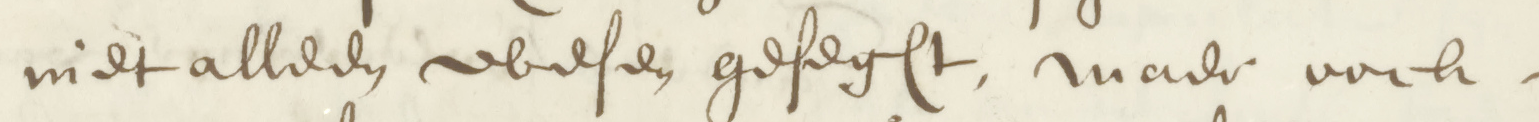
niet alleen wesen geseght, maer oock
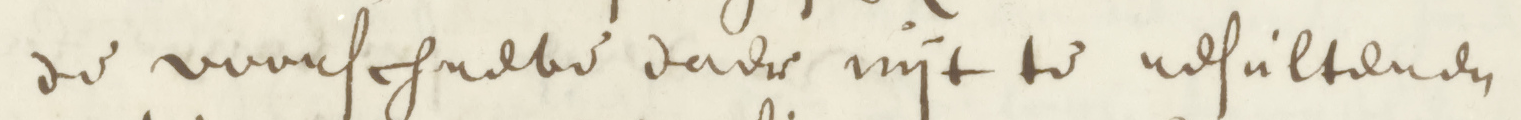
de voorschreve daer uijt te resulteren
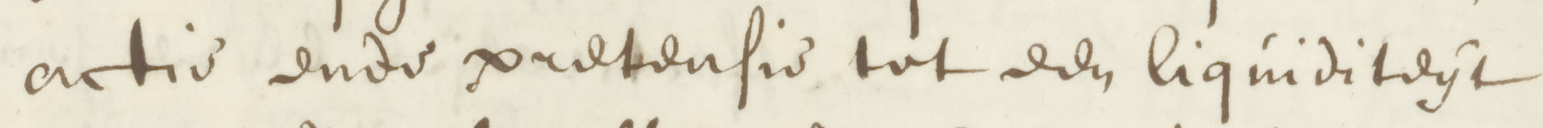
actie ende pretensie tot een liquiditeijt
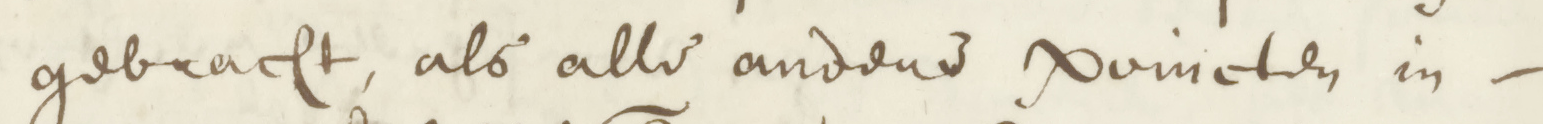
gebracht, als alle andere poincten in -
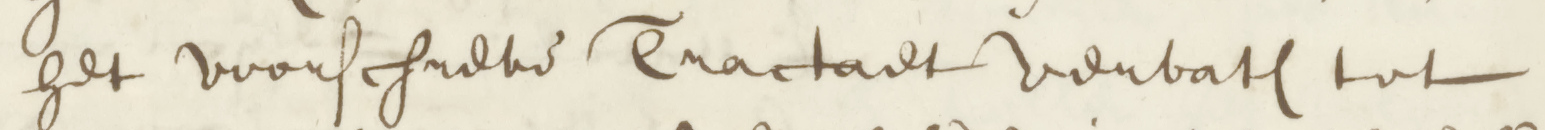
het voorschreve Tractaet vervath tot
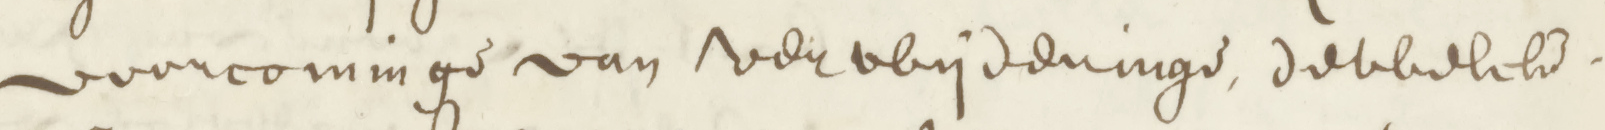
voorcominge van verwijderinge, dewelcke
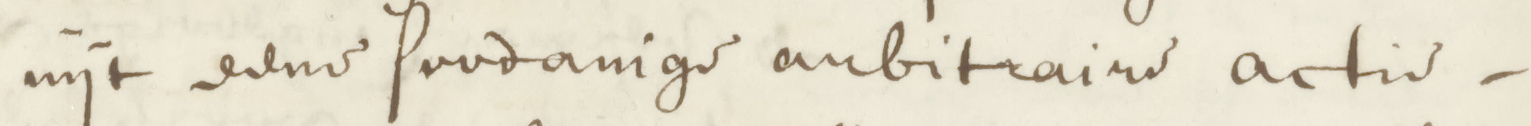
uijt eene soodanige arbitraire actie
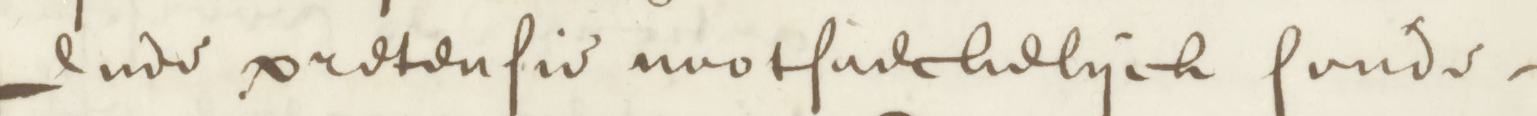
ende pretensie nootsaeckelijck soude
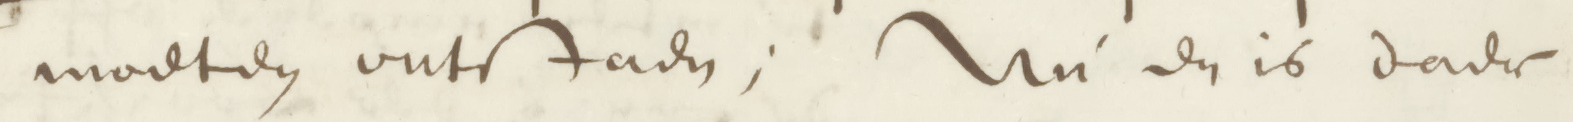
moeten ontstaen; Nu en is daer
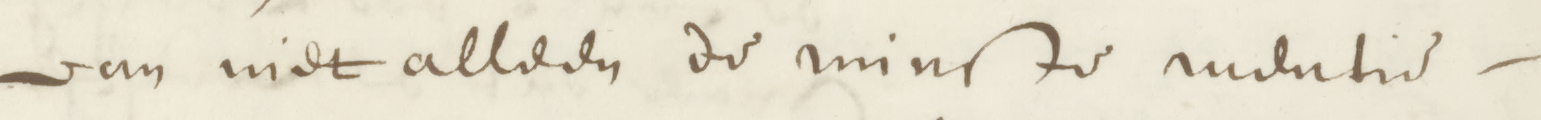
van niet alleen de minste mentie
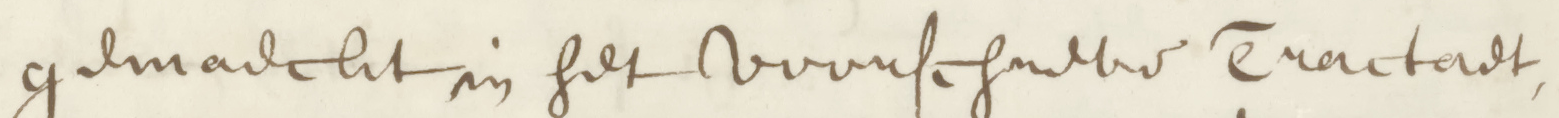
gemaeckt in het voorschreve Tractaet,
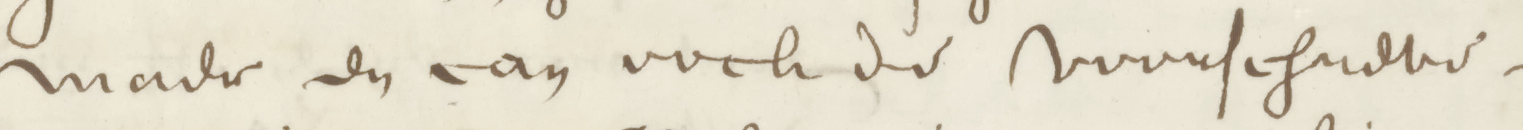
maer en can oock de voorschreve
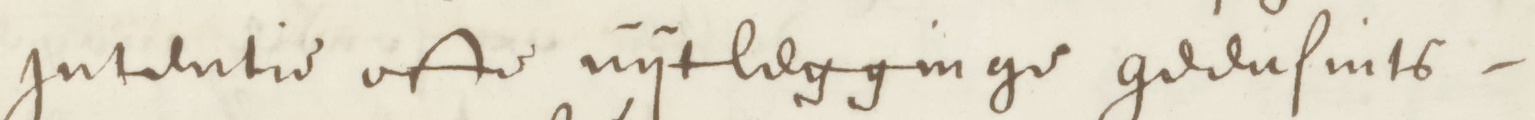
intentie ofte uijtlegginge geensints
